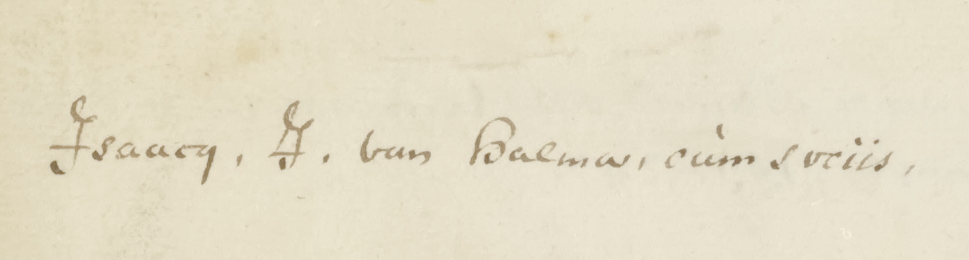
Isaacq, I. van Halma, cum sociis
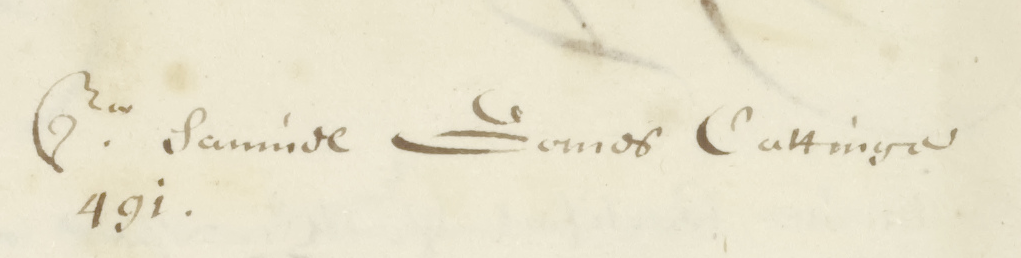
ϭa. Samuel Gomes Cattinge
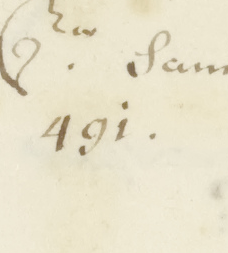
491.
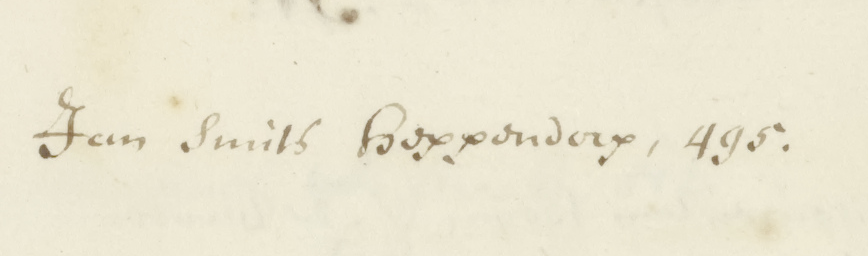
Jan Smits Heppendorp, 495.
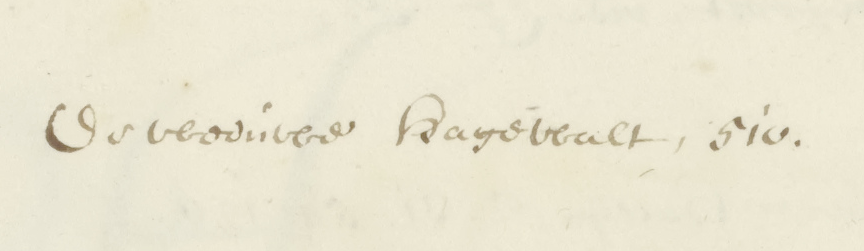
De weduwe Hagewalt, 510.
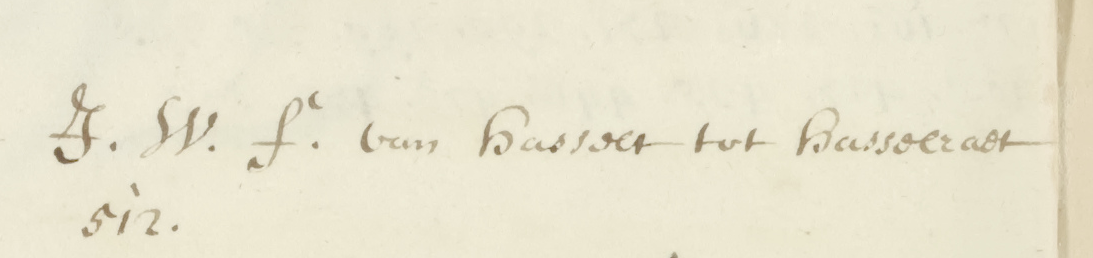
J.W.f. van Hasselt tot Hasselraet
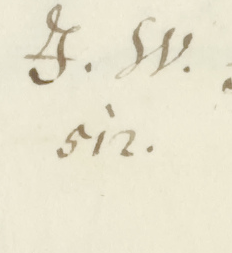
512.
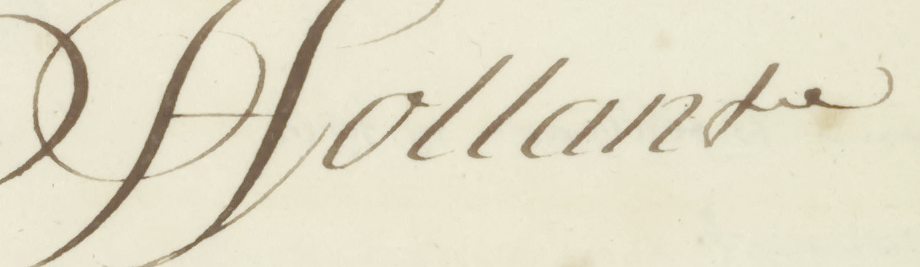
Hollant
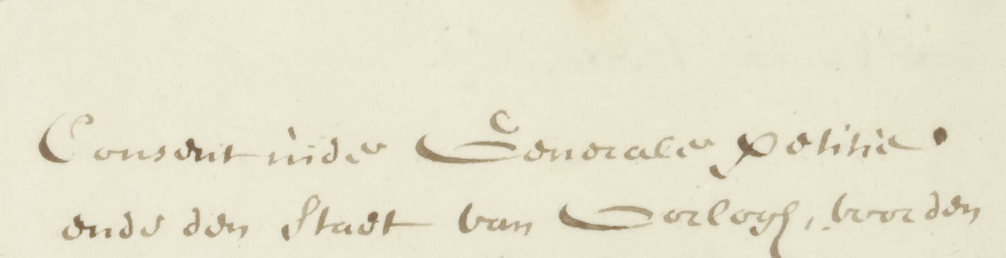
Consent inde Generale petitie
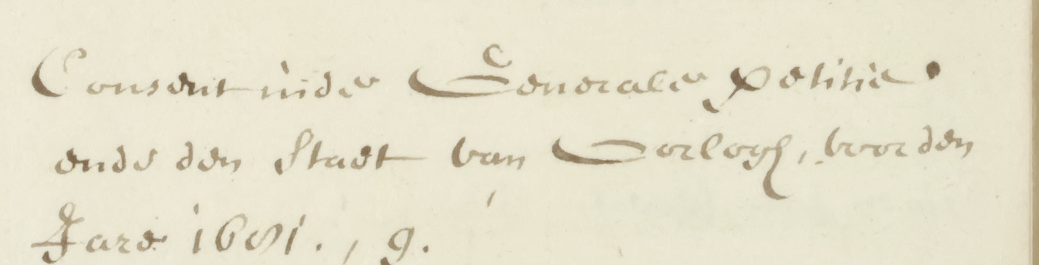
ende den Staet van Oorlogh, voor den
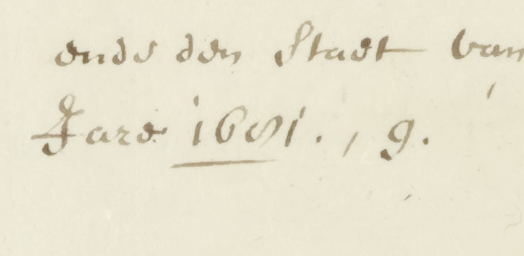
Jare 1681., 9.
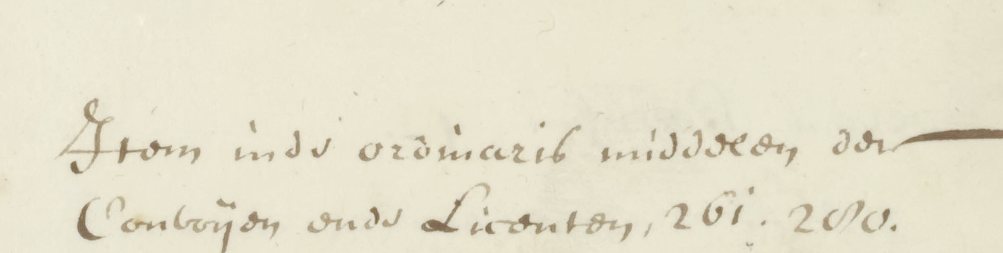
Item inde ordinaris middelen der
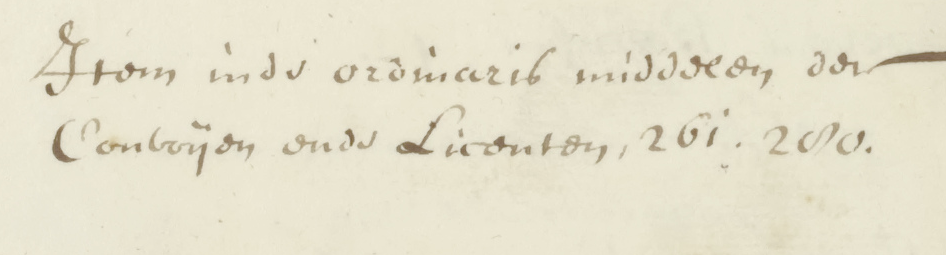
Convoijen ende Licenten, 261, 280.
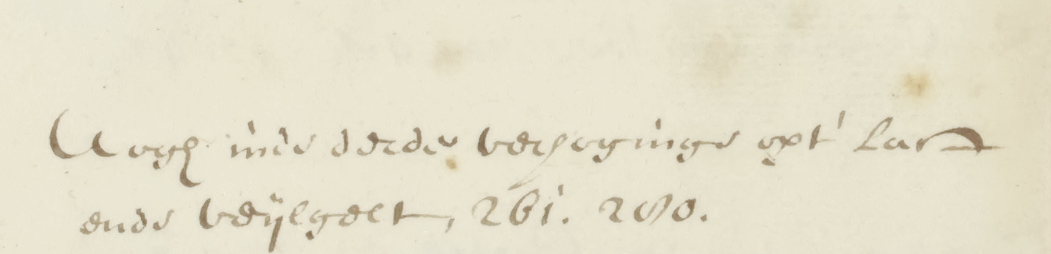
Nogh inde derde verhoginge opt' Last
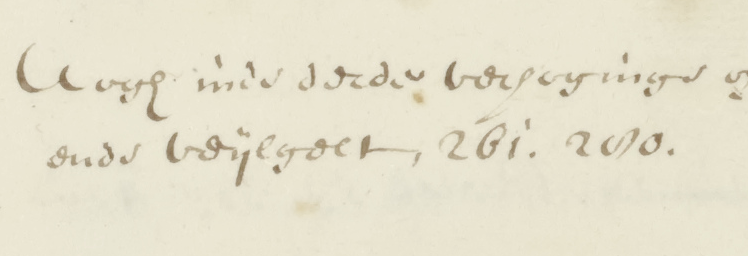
ende veijlgelt, 261, 280.
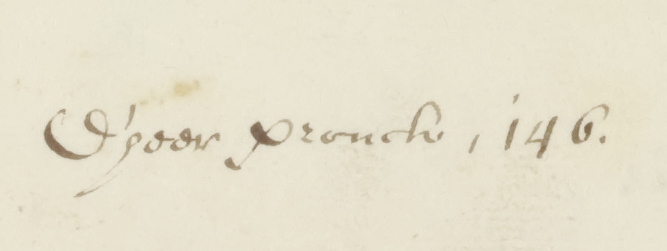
D'heer Pronck, 146.
